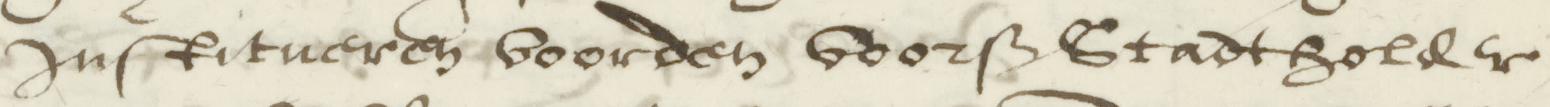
institueren voorden voors Stadtholder
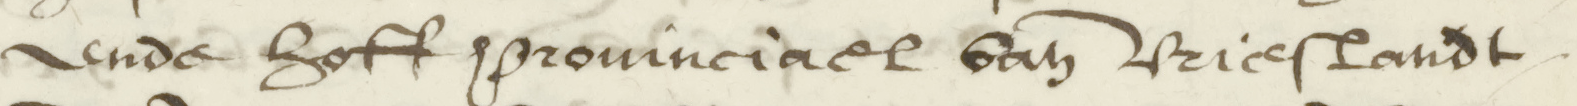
ende Hoff provinciael van Vrieslandt
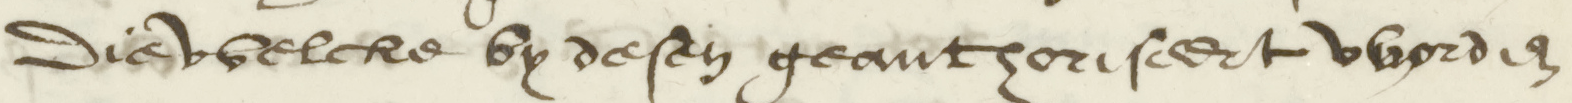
die welcke by desen geauthoriseert worden
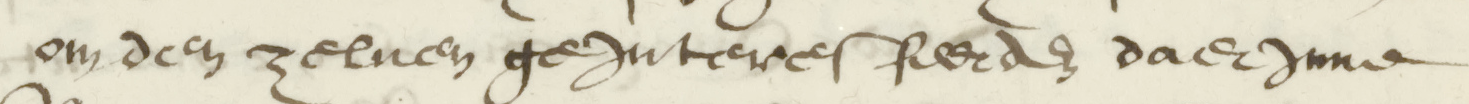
om den zeluen geinteresseerden daerinne
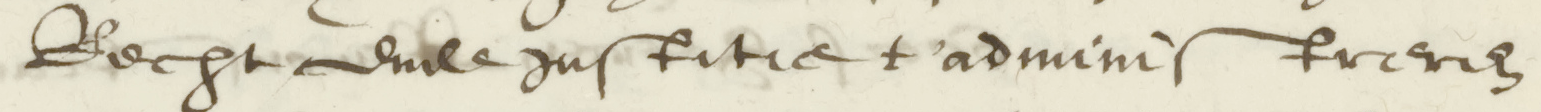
Recht ende justitie t'administreren
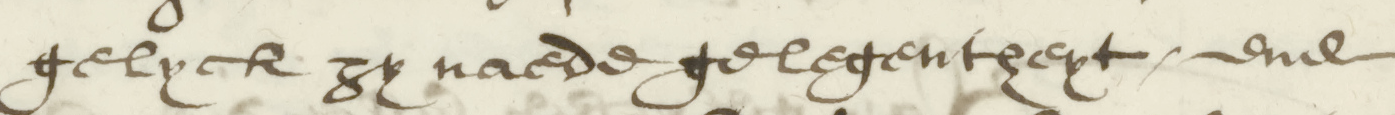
gelyck zy naede gelegentheyt, ende
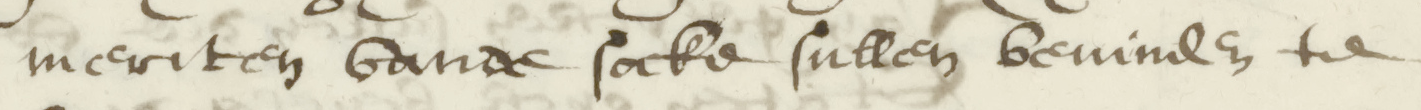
meriten vande sake sullen beuinden te
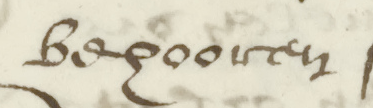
behooren.
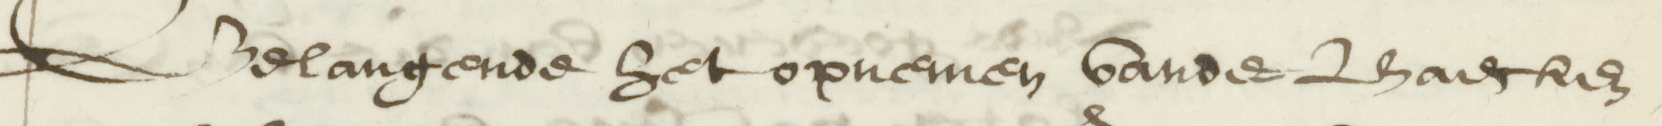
Belangende het opnemen vande Baecken,
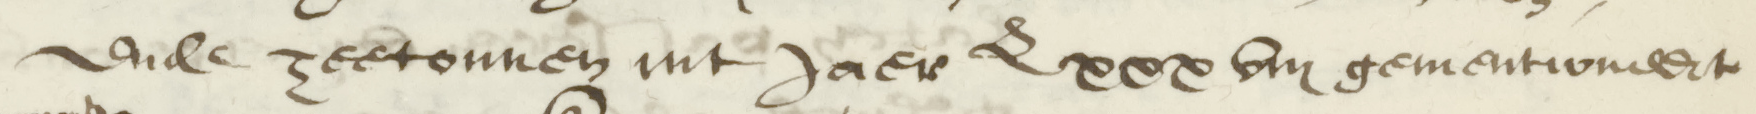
ende zeetonnen int jaer lxxxviii gementioneert
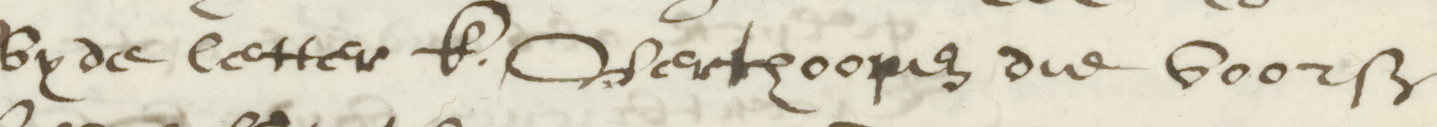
by de letter R. verthoonen die voors
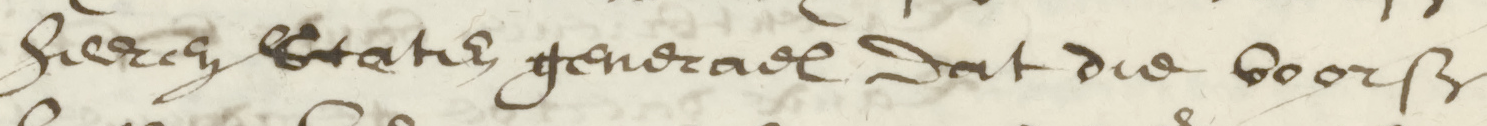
heeren Staten Generael dat die voors
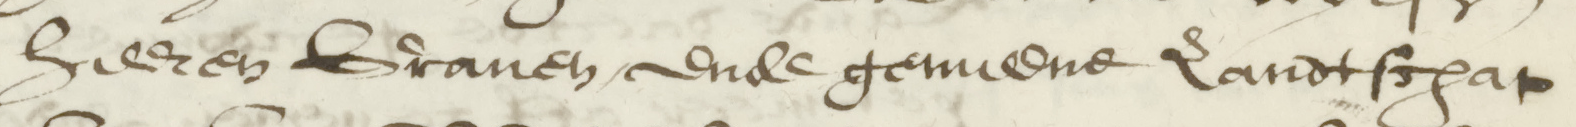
heeren Grauen, ende gemeene Landtschap
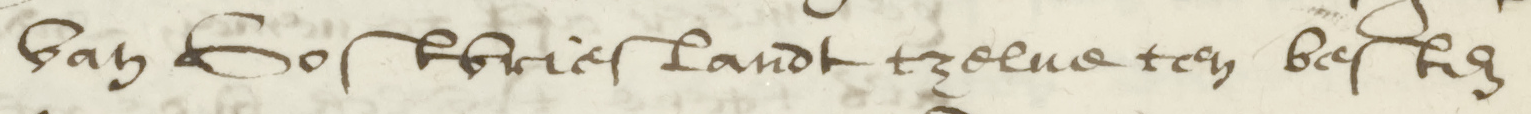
van Oostvrieslandt tzelue ten besten
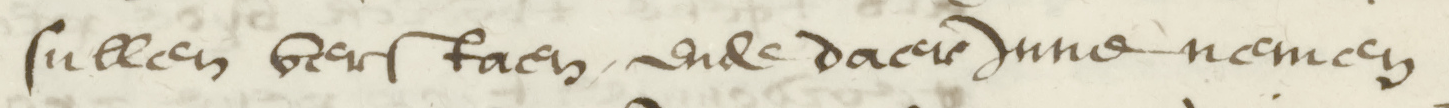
sullen verstaen ende daerinne nemen
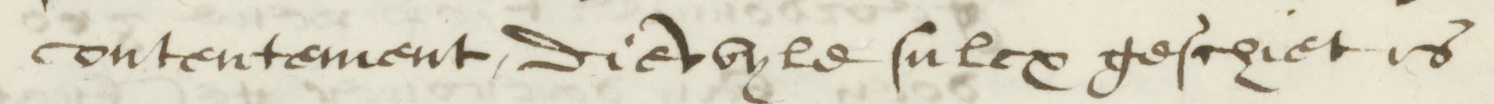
contentement, diewyle sulcx geschiet is
